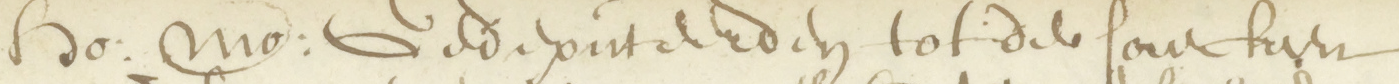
Ho:Mo: Gedeputeerden tot de saecken
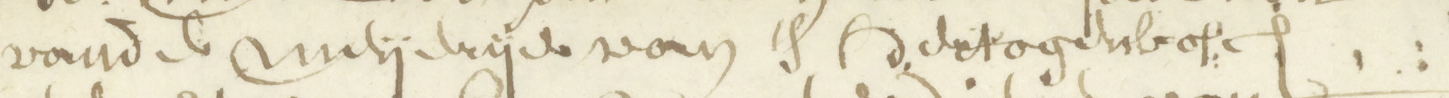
vande Meijerije van ‛s Hertogenbosch:
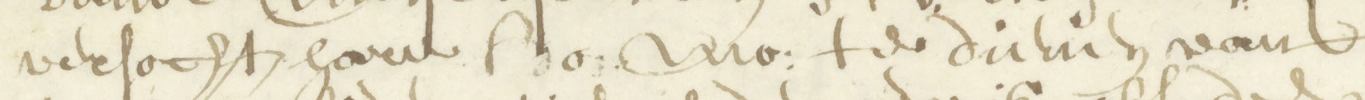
versocht, hare Ho:Mo: te dienen van
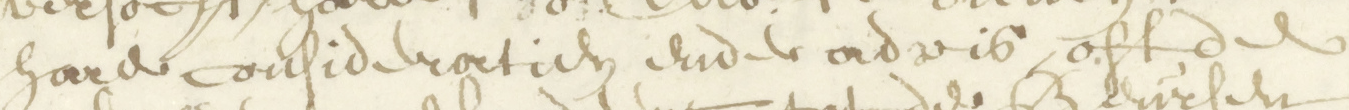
hare consideratien ende advis, off de
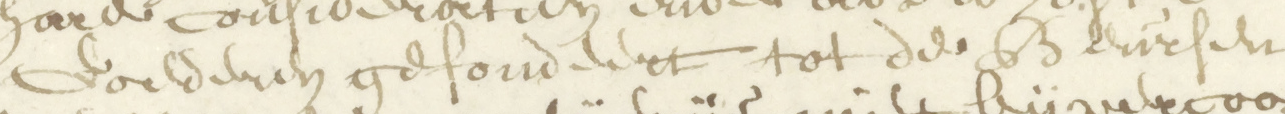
Goederen gefondeert tot de Beursen
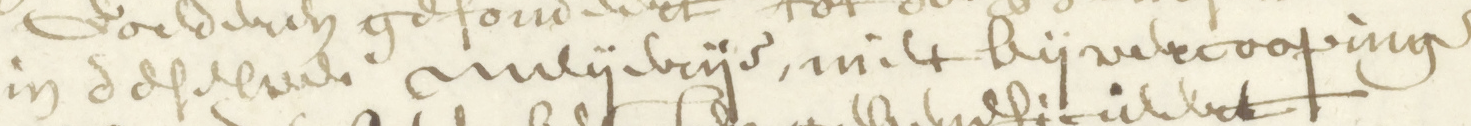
in deselve Meijerije, niet bij vercoopinge
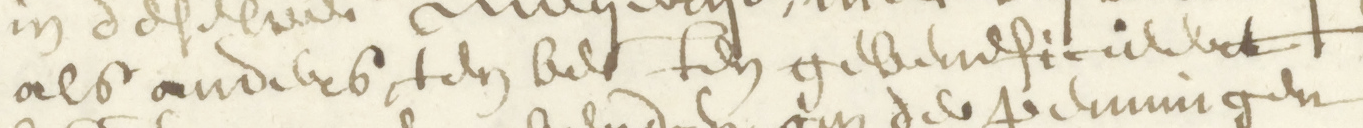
als anders, ten besten gebeneficieert
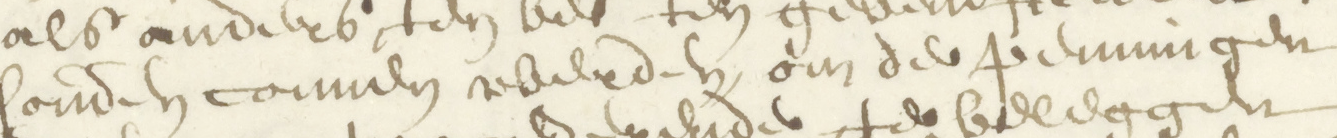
souden connen werden, om de penningen
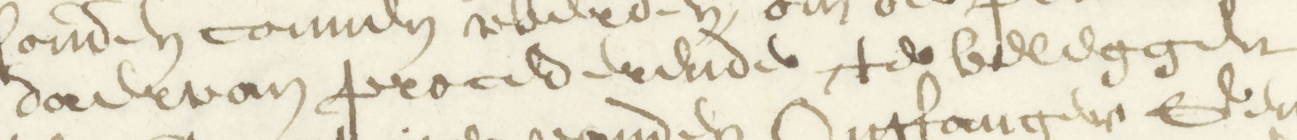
daervan procederende, te beleggen
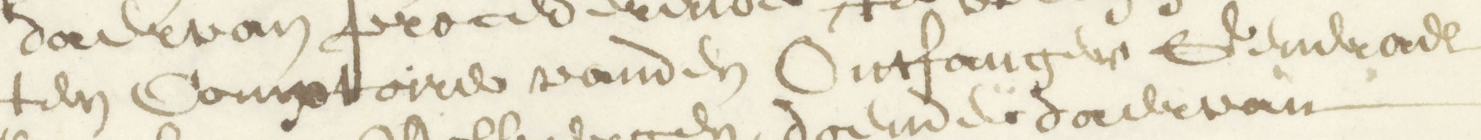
ten Comptoire vanden Ontfanger Generael
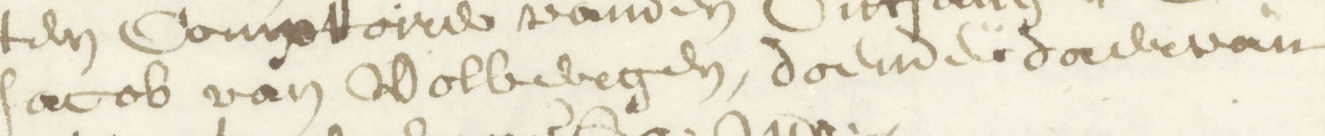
Jacob van Volbergen, doende daervan
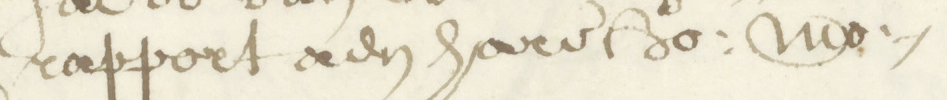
rapport aen hare Ho:Mo:
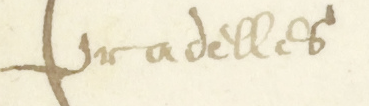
Pradelles
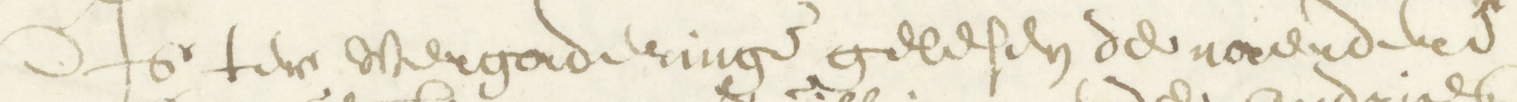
Is ter Vergaderinge gelesen de naerdere
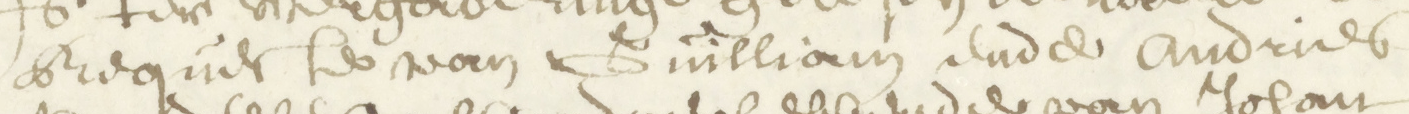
Requeste van Guilliam ende Andries
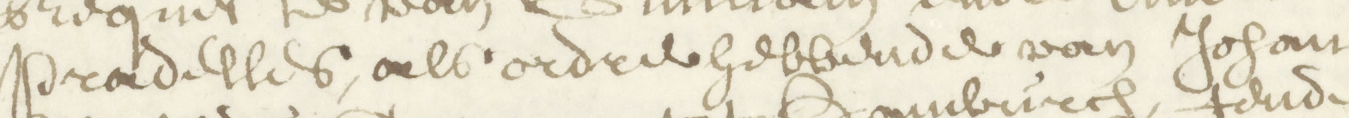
Pradelles, als ordre hebbende van Johan
